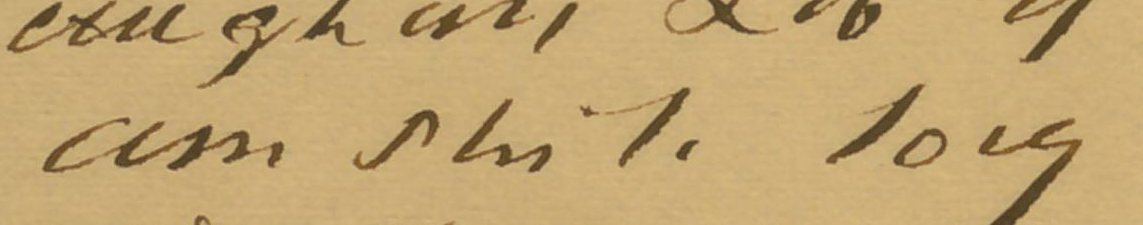Am Phil. Socy
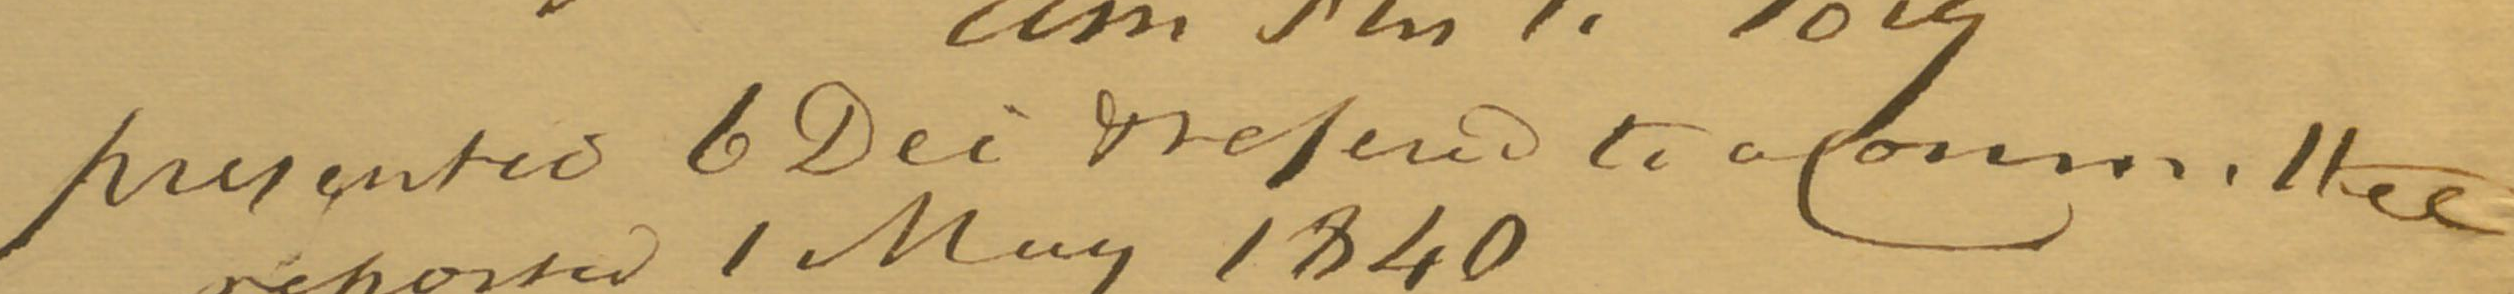presented 6 Dec & refered to a Committee
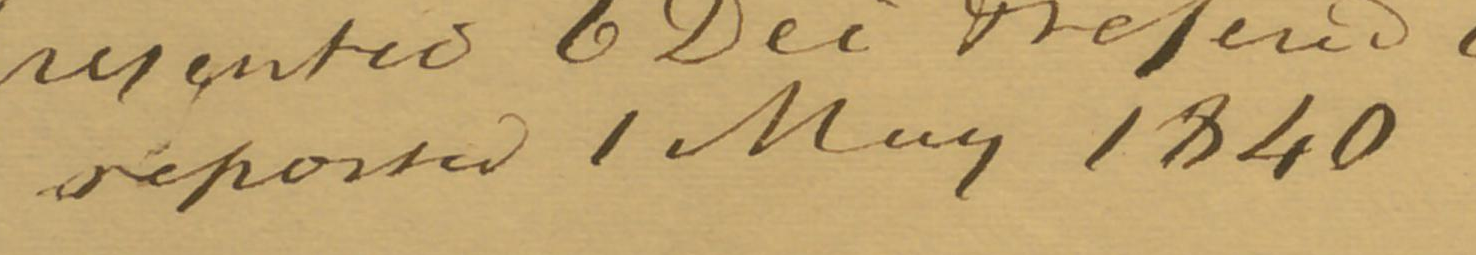reported 1 May 1840
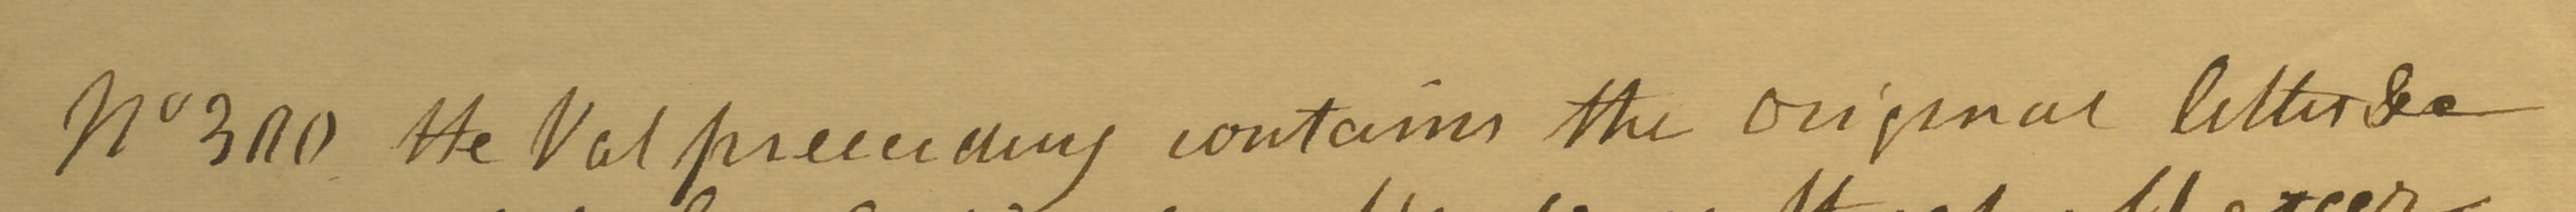N^o 300 the Vol preceeding contains the original letters &
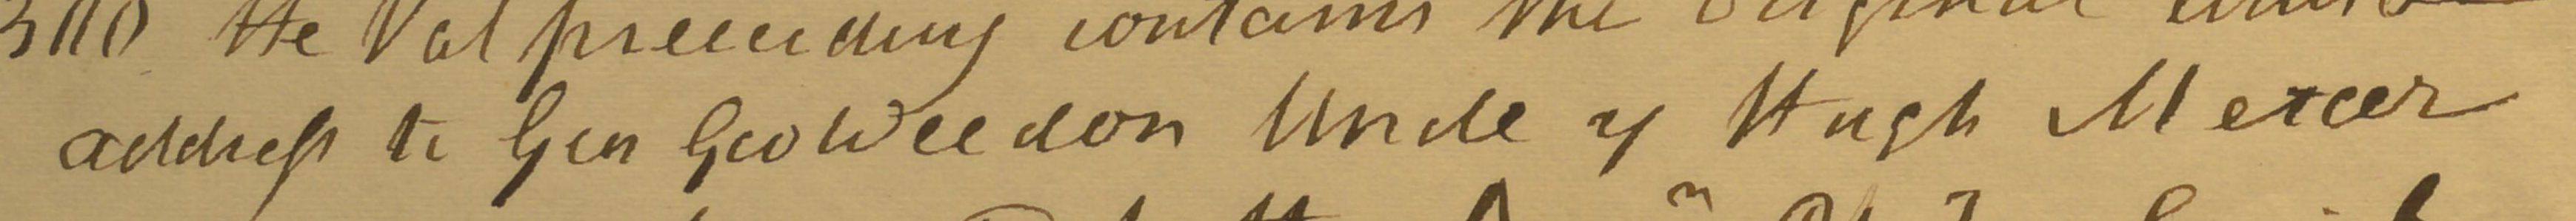address to Gen Geo Weedon Uncle of Hugh Mercer
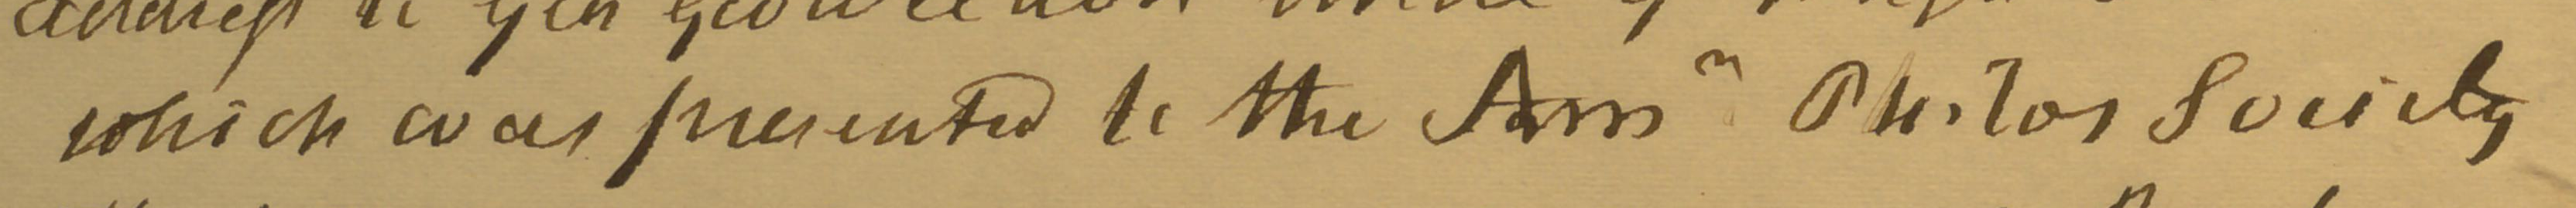which was presented to the Am^n Philos Society
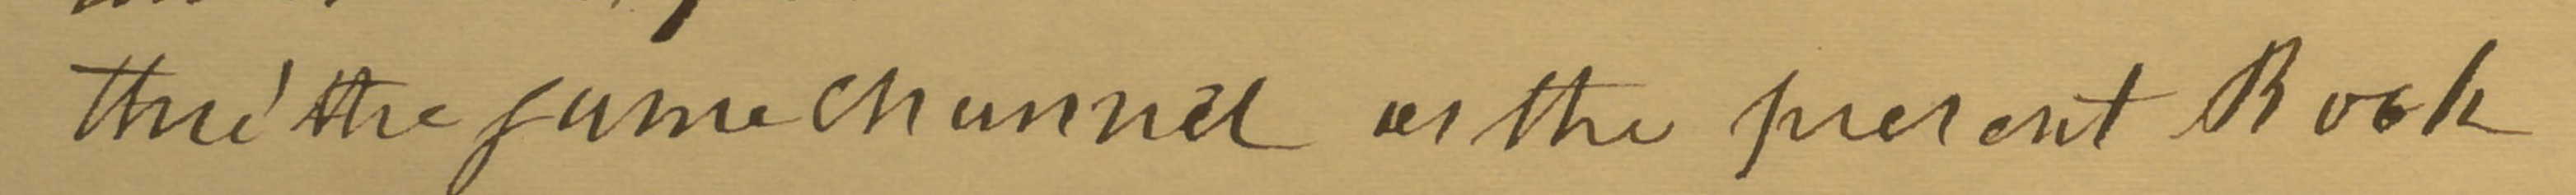thru' the same channel as the present Book
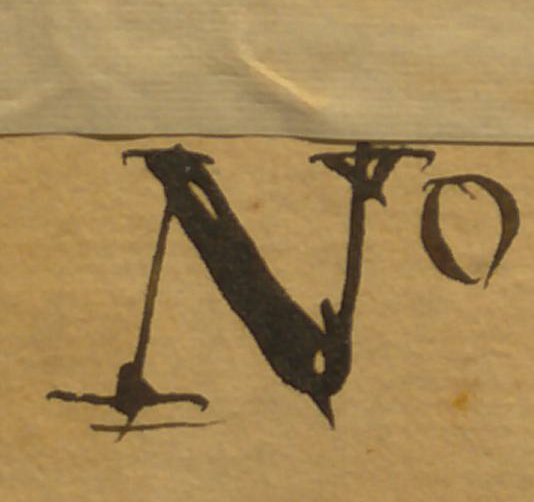N^o
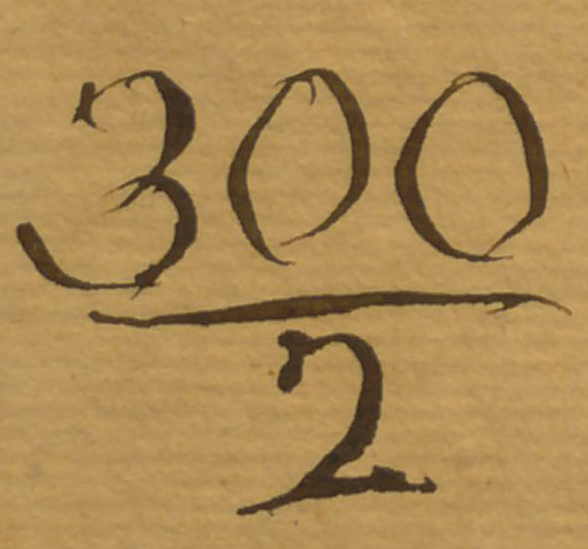300
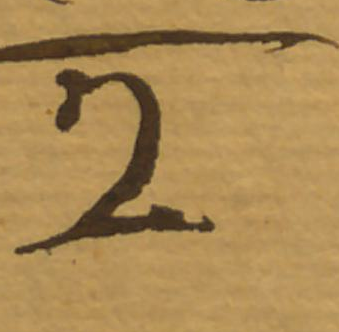2
